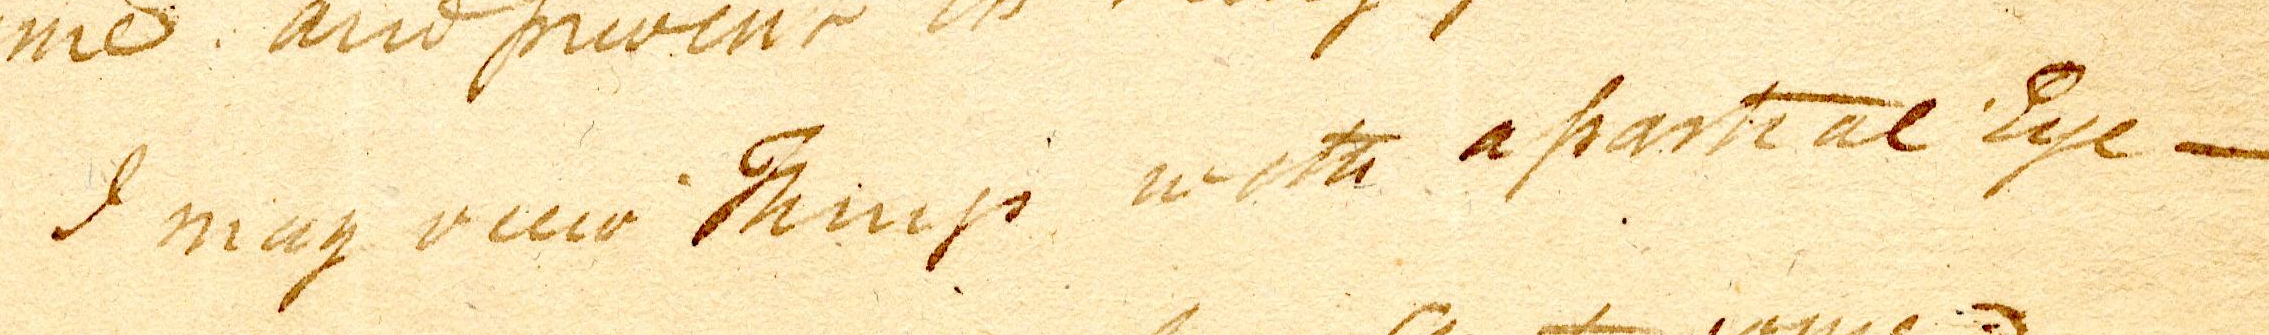I may view Things with a partial Eye
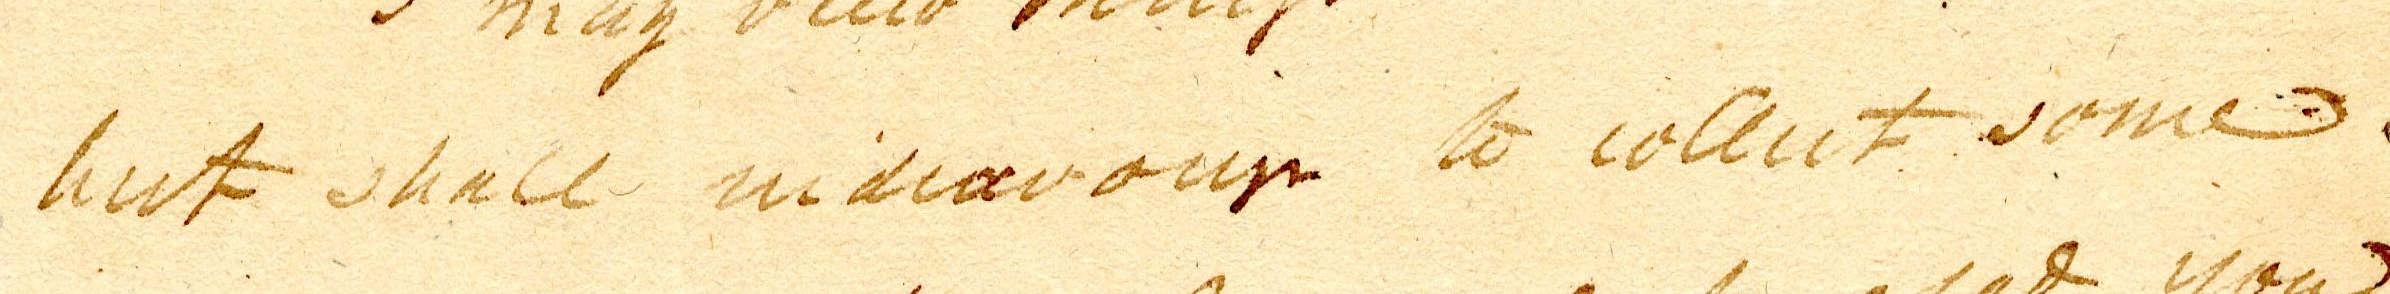but shall endeavour to collect some
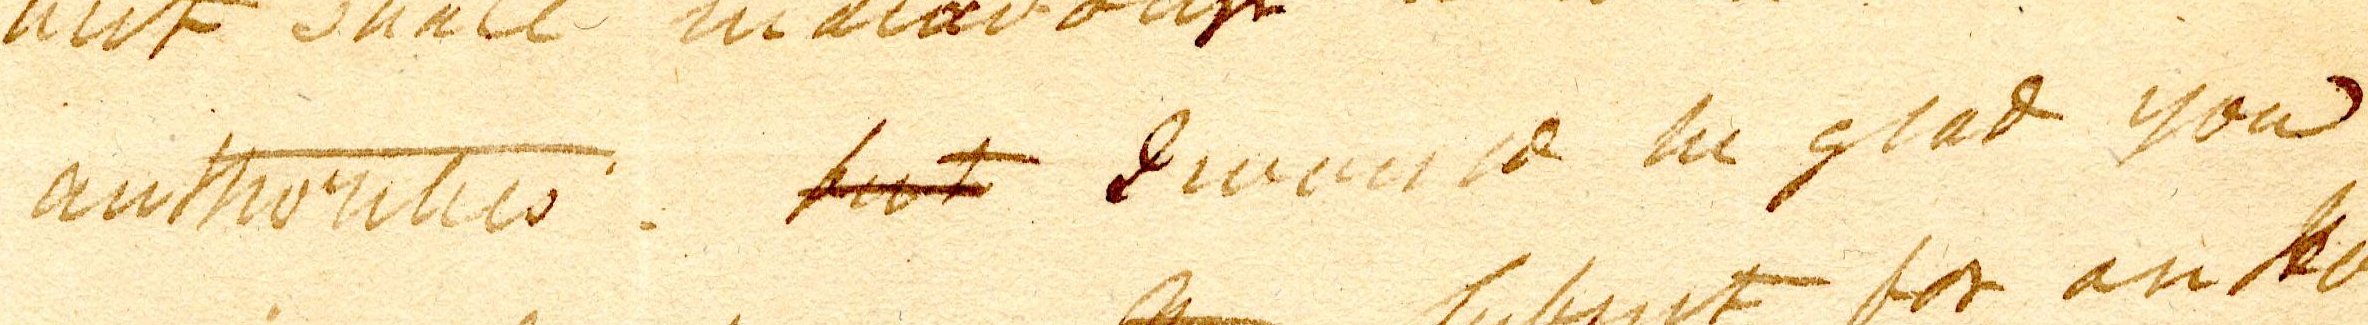authorities. but I would be glad you
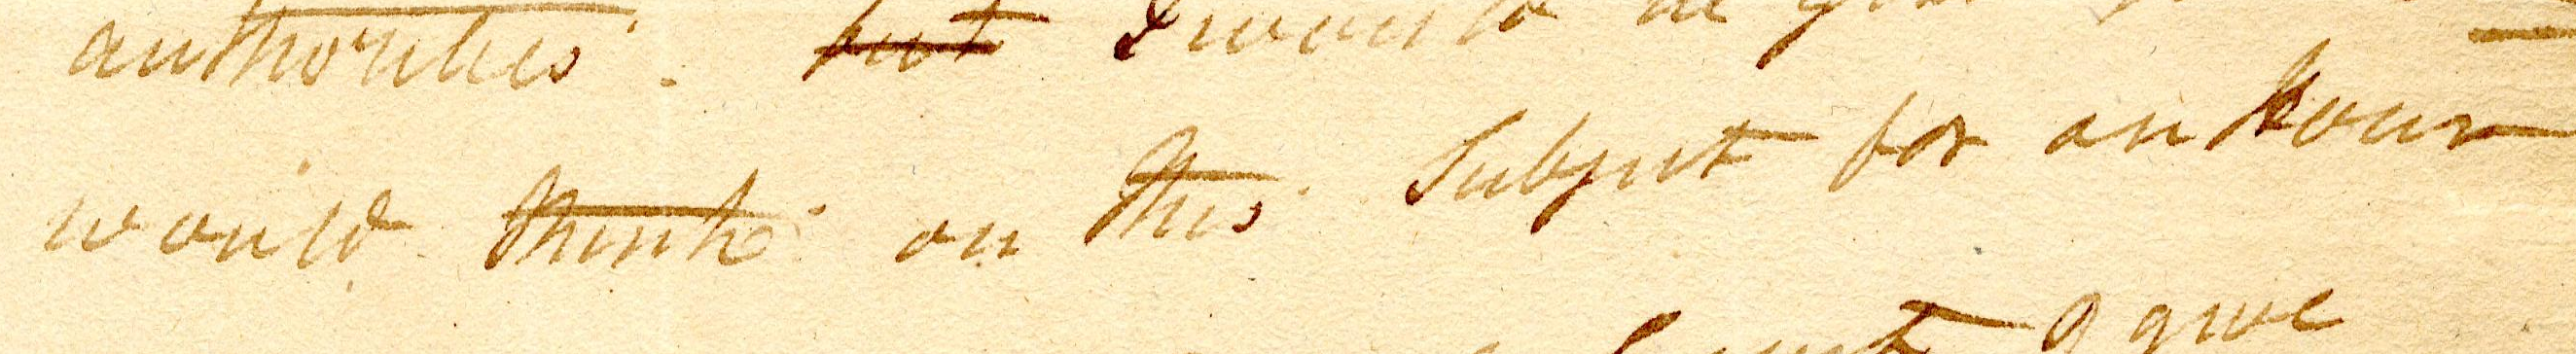would think on this Subject for an hour
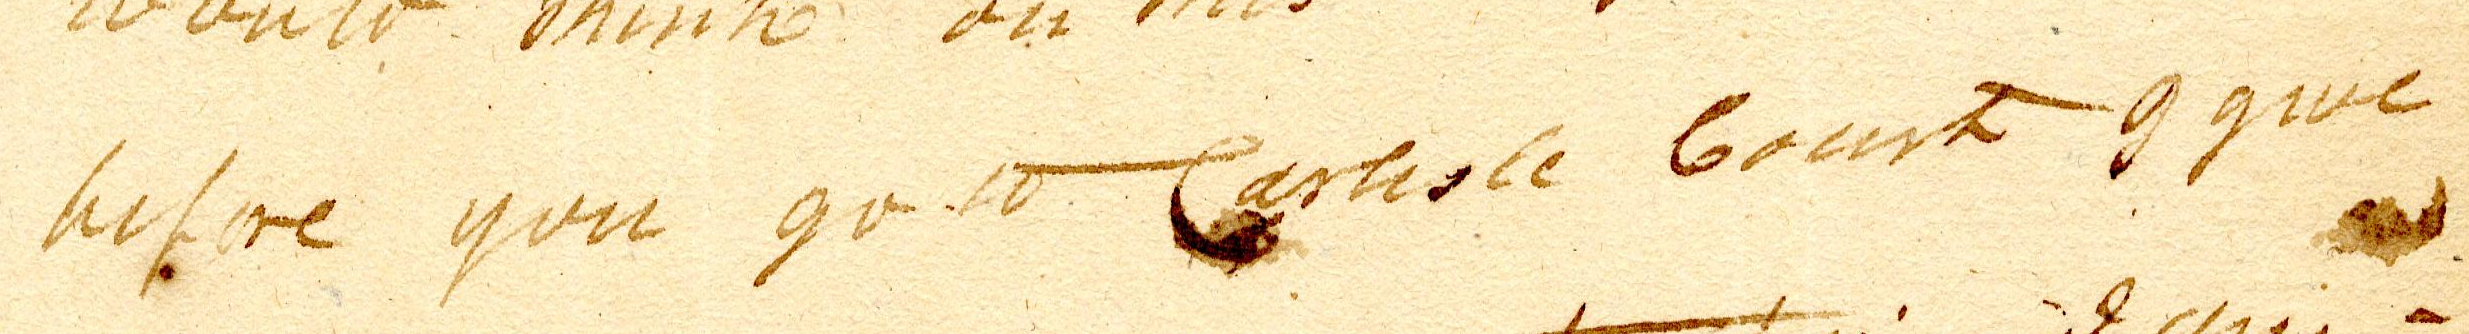before you go to Carlisle Court & give
